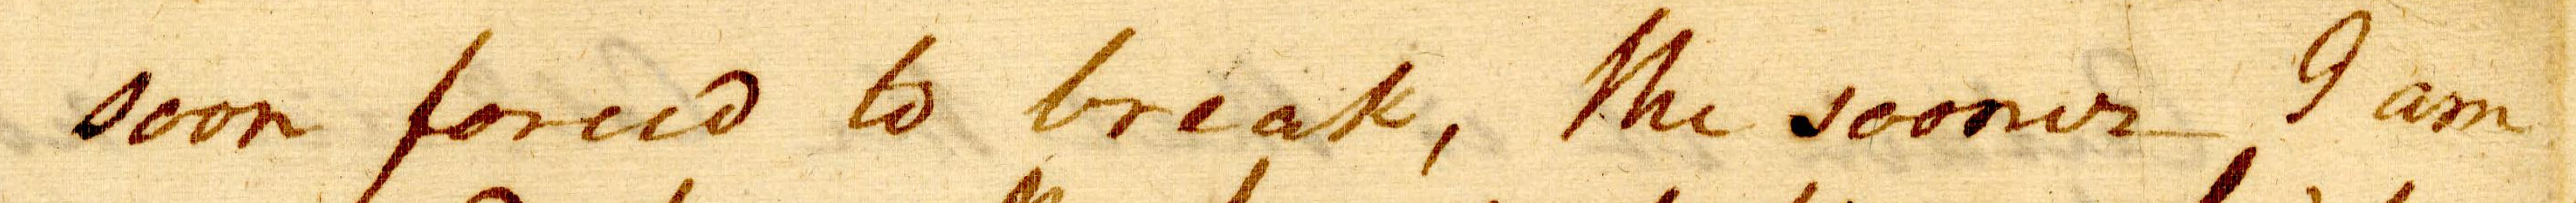soon forced to break, the sooner I am
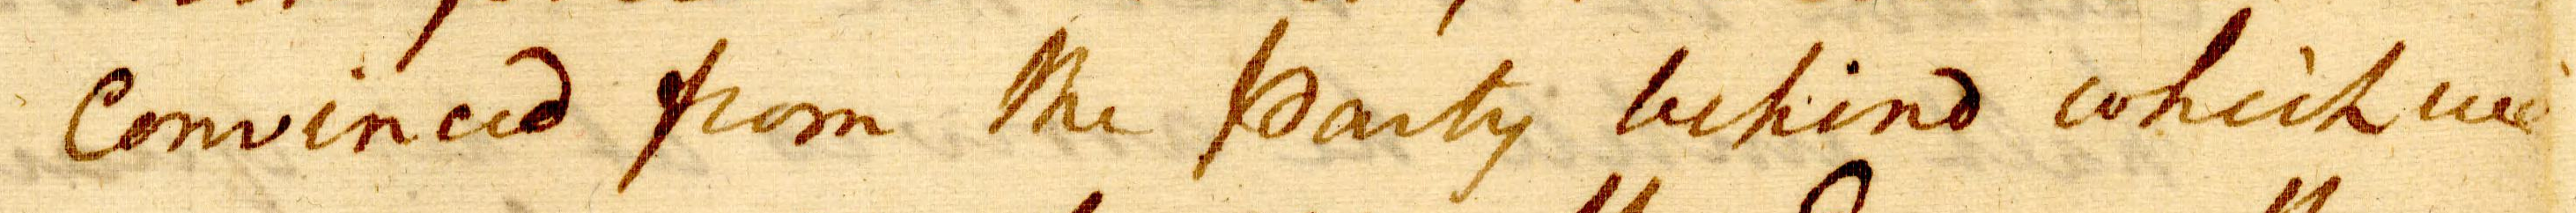convinced from the party behind which we
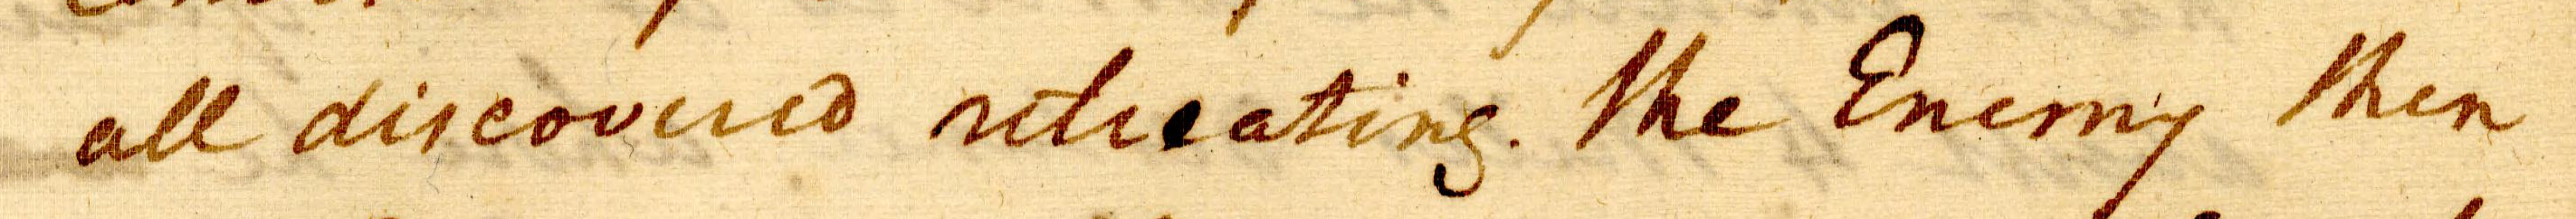all discovered retreating the Enemy then
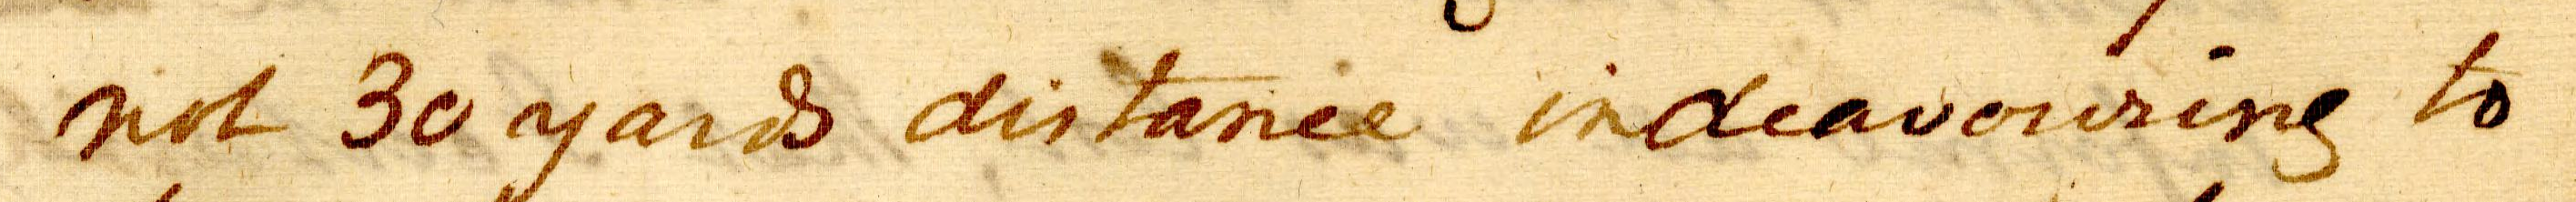not 30 yards distance indeavouring to
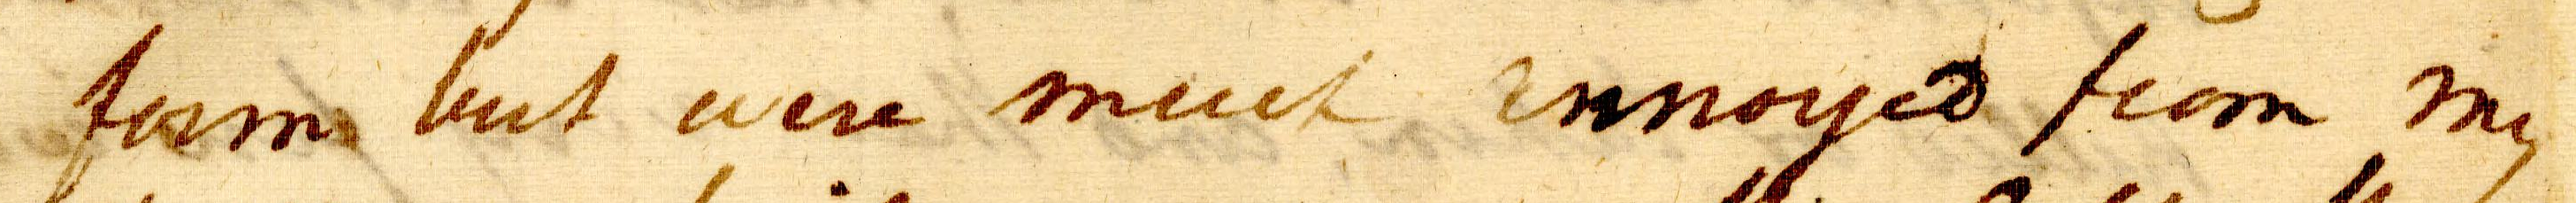form but were much annoyed from my
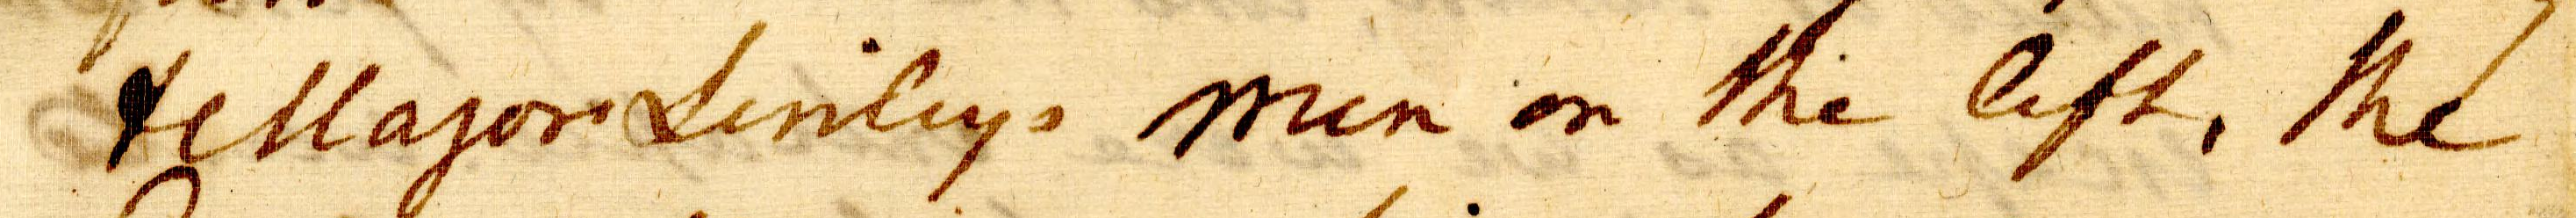& Major Linleys men on the left, the
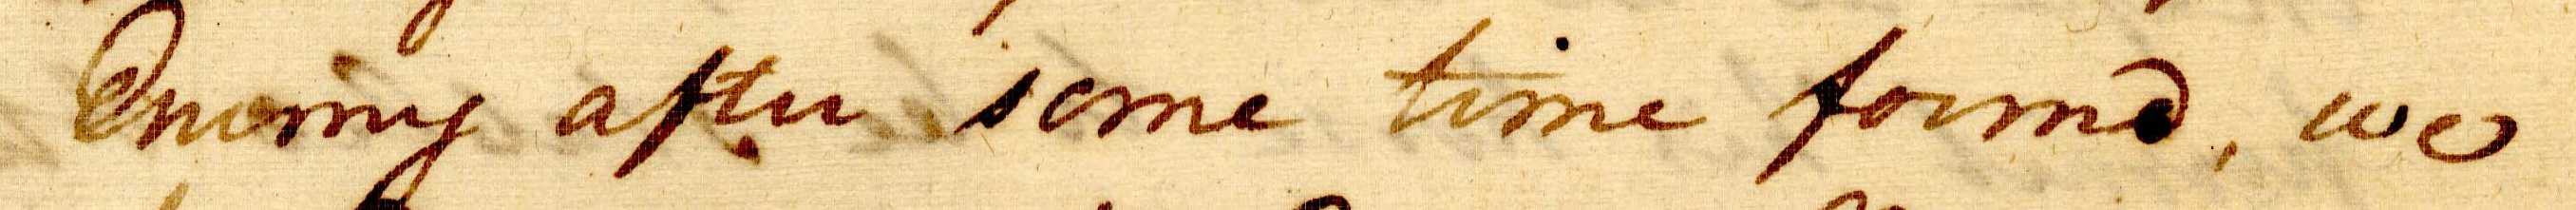Enemy after some time formd, we
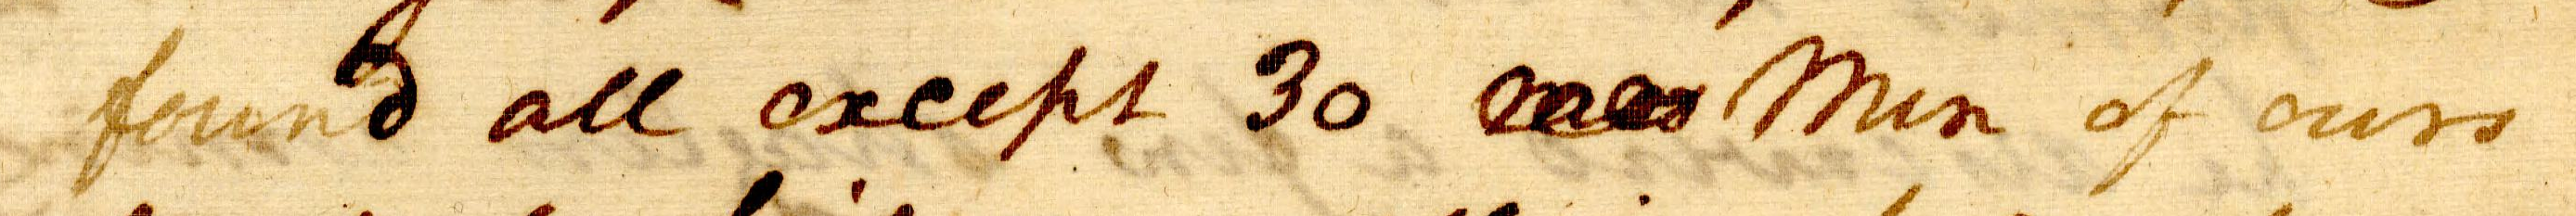found all except 30 Men of ours
